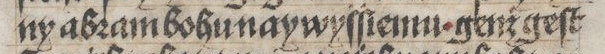ny abram bohu naywyẛẛiemu.genż geſt
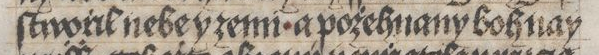ſtwoṙil nebe y zemi.a pożehnany boh nay
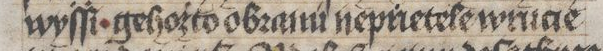wyẛẛi.gehożto obranú nepṙieteẛe wrucie
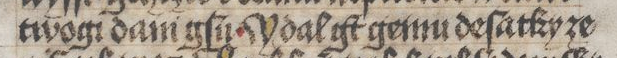twogi dani gſi.Y dal ḡt gemu deſatky ze¬
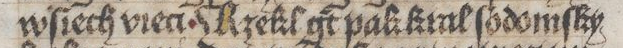wẛíech vieci.Rzekl ḡt pak kral ſodomſky
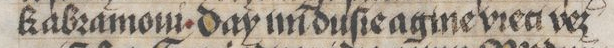k abramoui.Day mi duẛie a gine veci wez¬
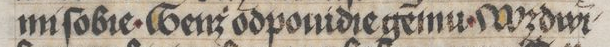mi ſobie.Genż odpouidie gemu.Wzdwi¬
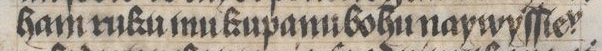hanI ruku mu kupanu bohu naywyẛẛiev
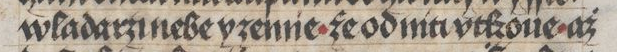wladarzi nebe y zemie.że odníti vtkoue.aż
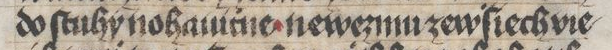do ſtuhy nohauiċne.newezmu ze wẛíech vie¬
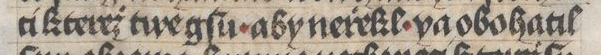ci ktereż twe gſu.aby neṙekl.ya obohatil
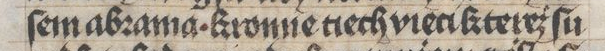ſem abrama.kromie tiech vieci ktereż ſu
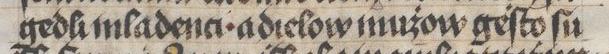gedli mladencí.a dielow mużow geẛto ſu
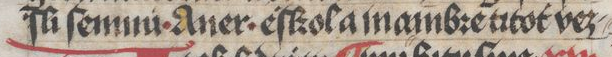ẛli ſemni. Aner.eẛkol a mambre titoṫ vez
